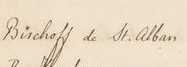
Bischoff de St. Alban
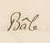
Bâle
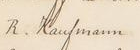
R. Kaufmann
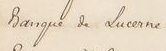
Banque de Lucerne
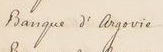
Banque d'Argovie
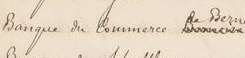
Banque du Commerce Bernoisede
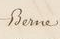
Berne
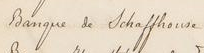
Banque de Schaffhouse
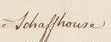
à Schaffhouse
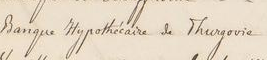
Banque Hypothécaire de Thurgovie
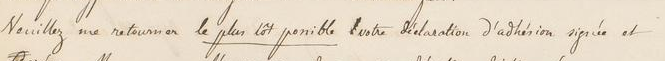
Veuillez me retourner le plus tôt possible votre déclaration d'adhésion signée et
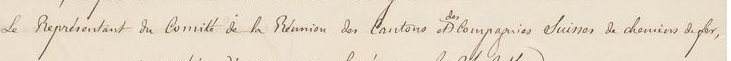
Le Représentant du Comité de la Réunion des Cantons et des Compagnies Suisses de chemins de fer,
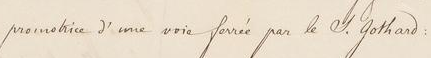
promotrice d'une voie ferrée par le S. Gothard:
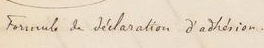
Formule de déclaration d'adhésion.
